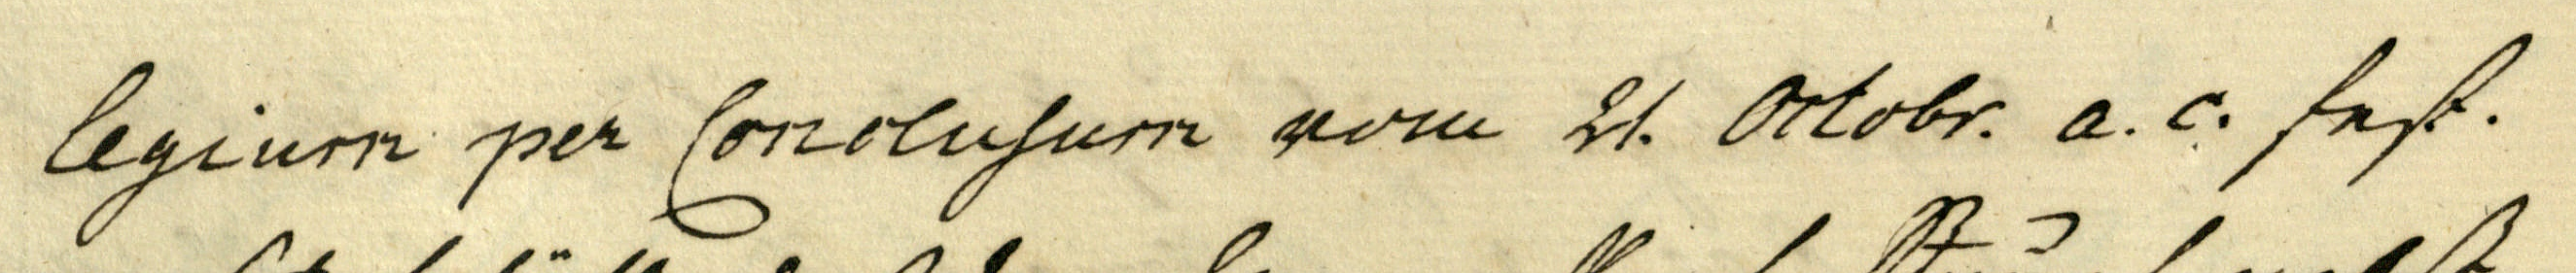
legium per Conclusum vom 21. Octobr. a. c. fest¬
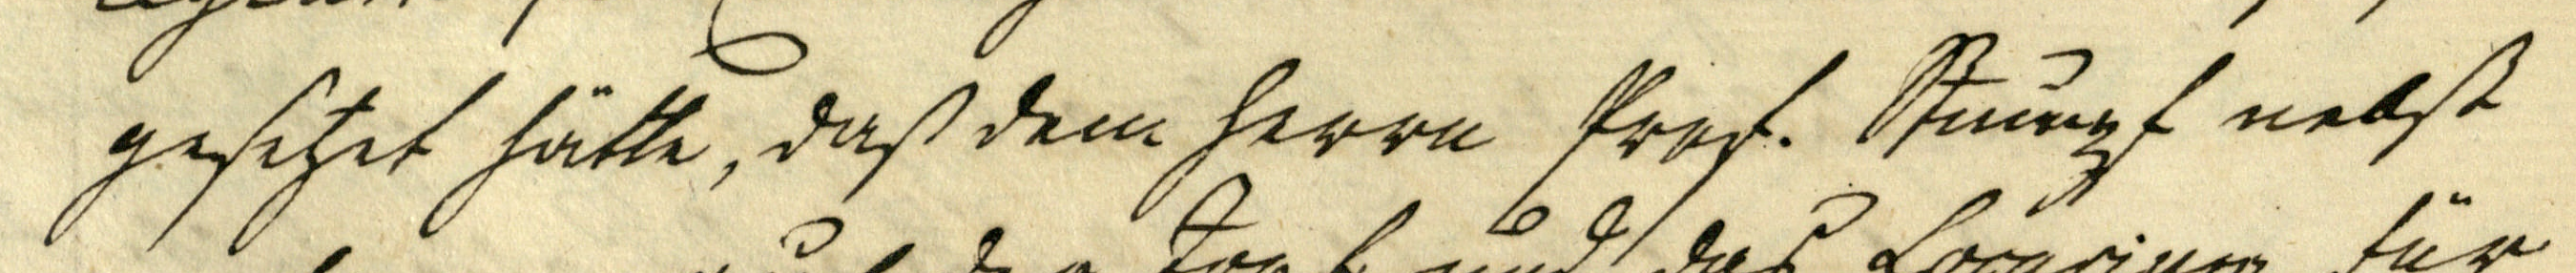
gesetzet hätte, daß dem Herrn Prof. Stumpf nebst
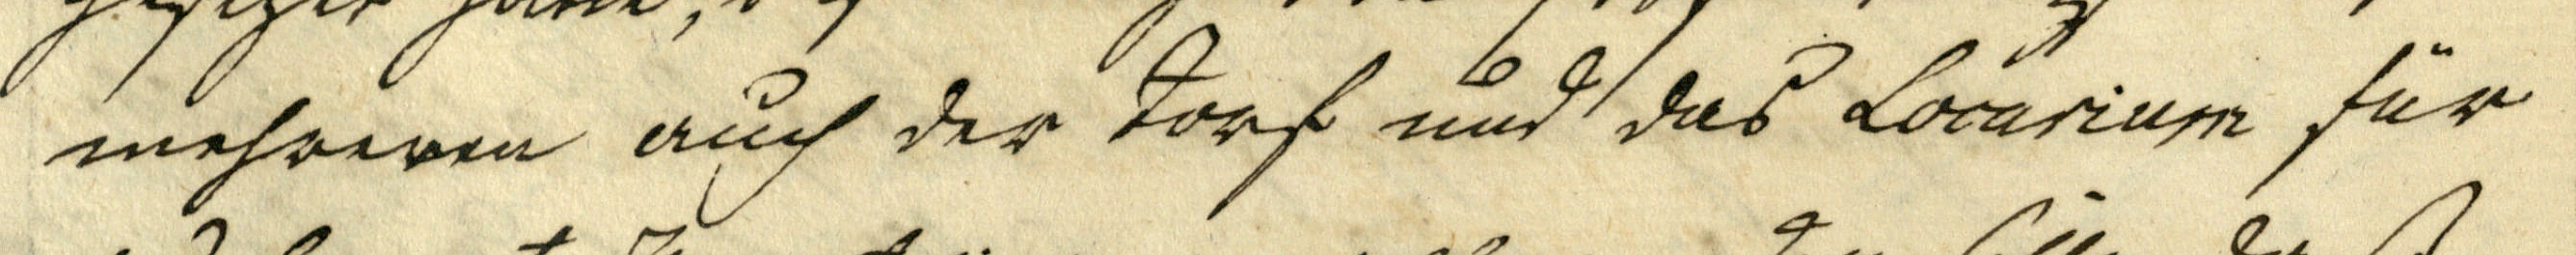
mehreren auch der Torf und das Locarium für
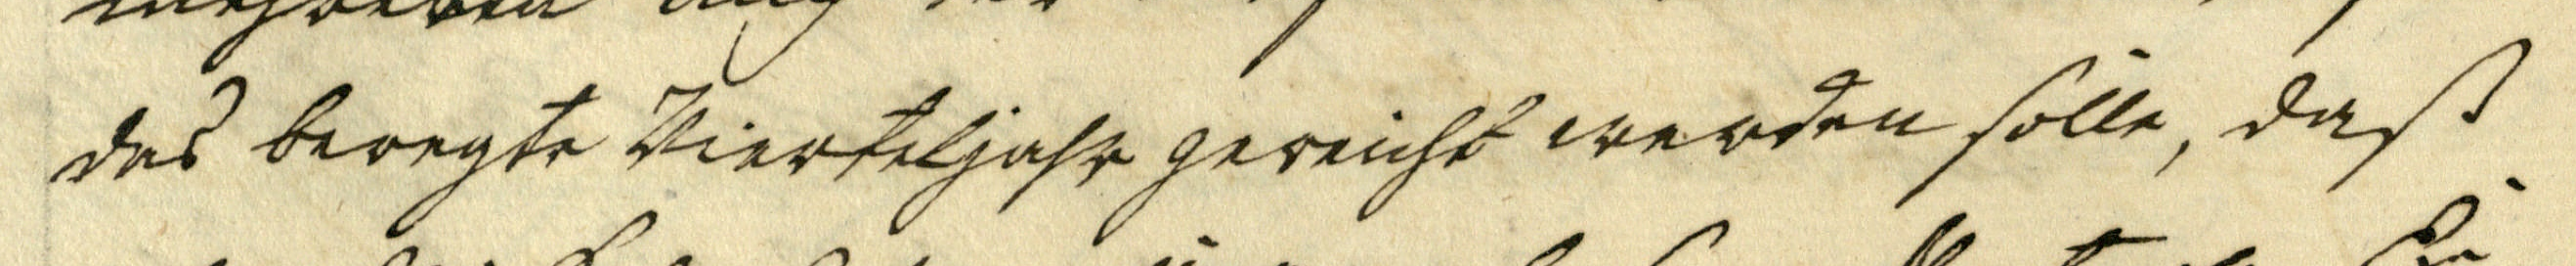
des beregte Vierteljahr gereicht werden solle, daß
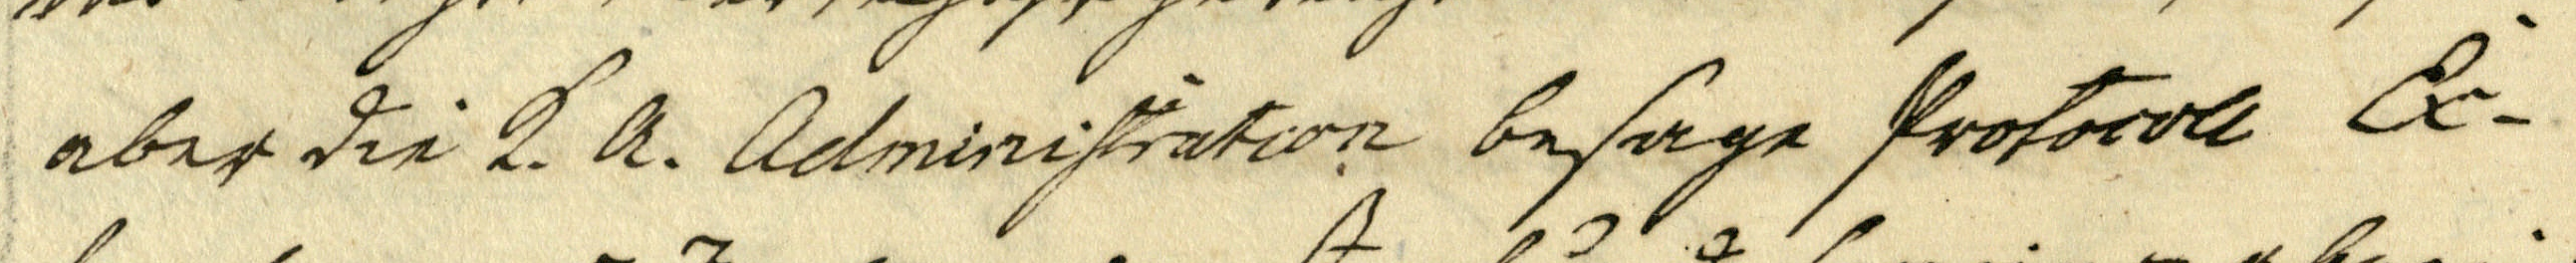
aber die K. A. Administration besage Protocoll Ex¬
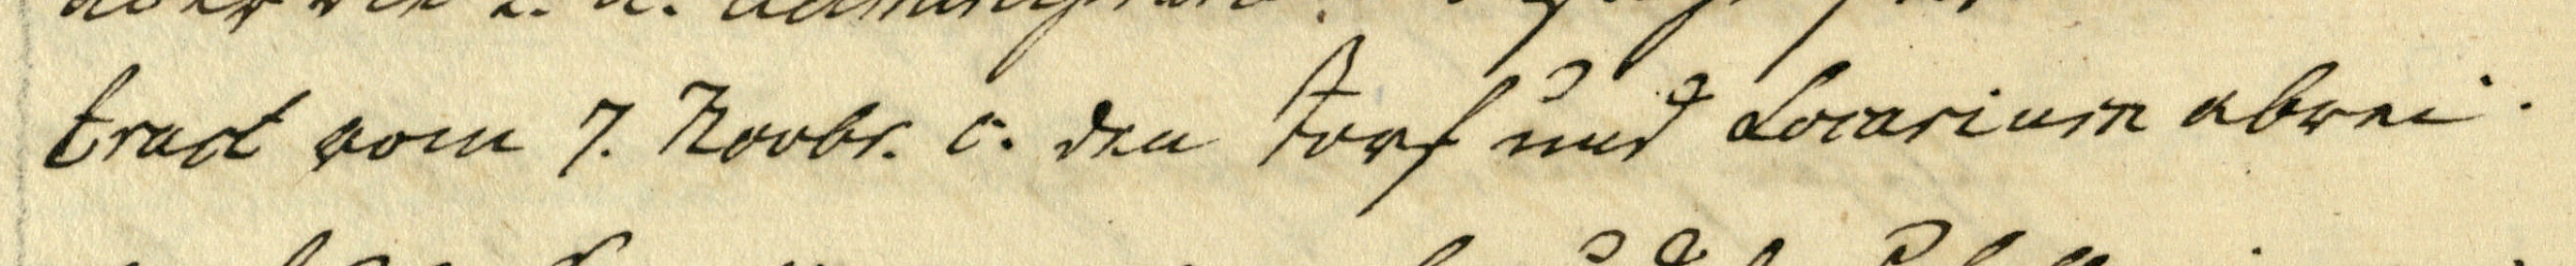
tract vom 7. Novbr. c. den Torf und Locarium abrei¬
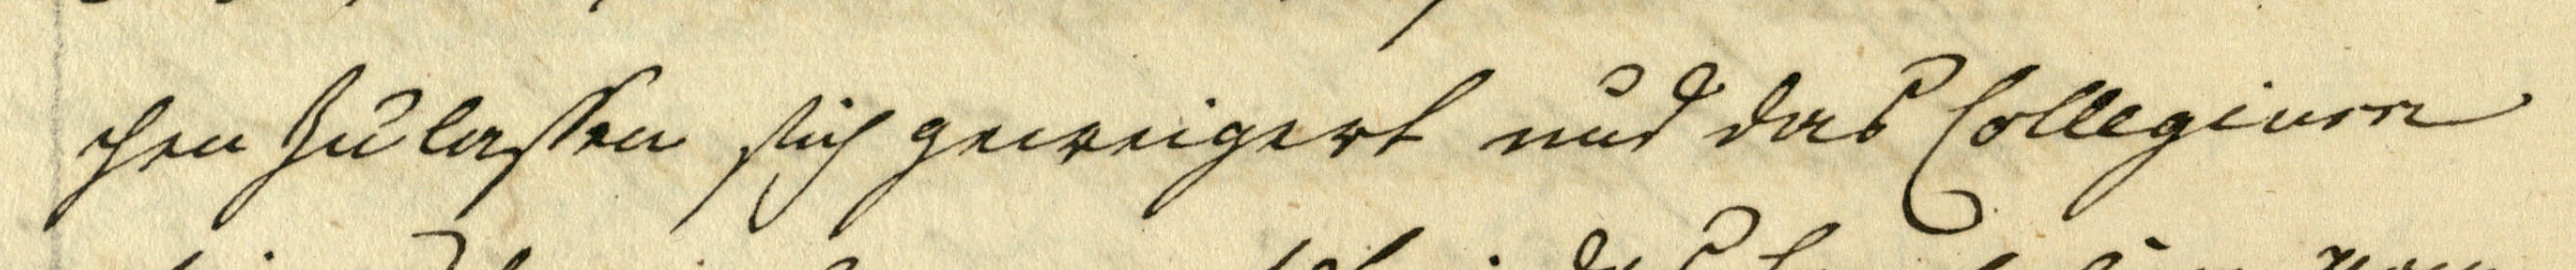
chen zu lassen sich geweigert und das Collegium
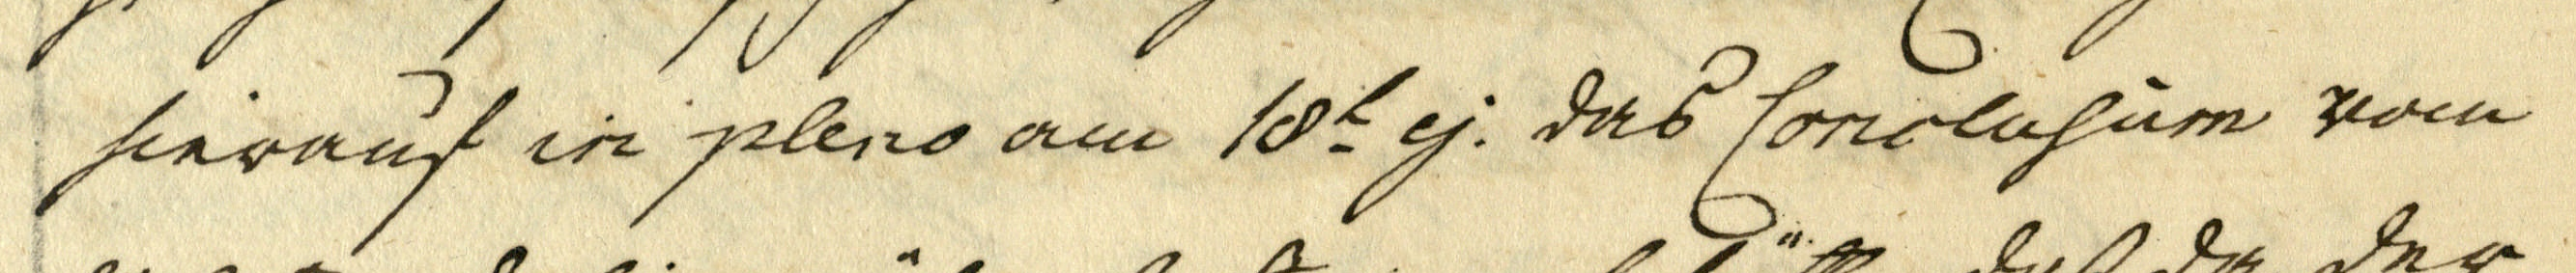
hierauf in pleno am 18. ej. das Conclusum vom
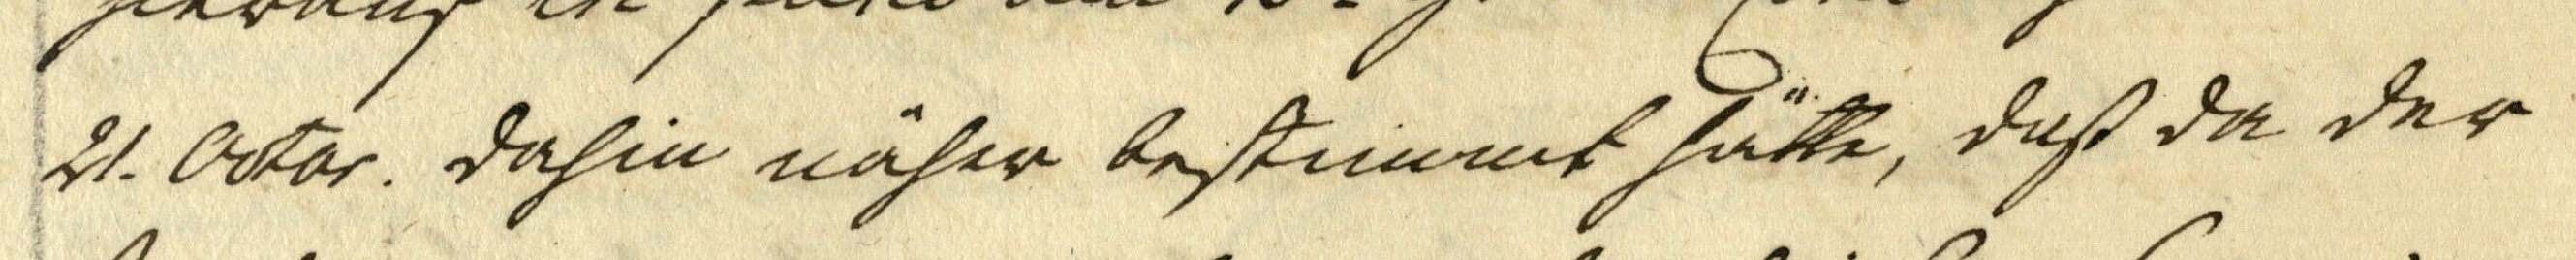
21. Octobr. dahin näher bestimmt hätte, daß da der
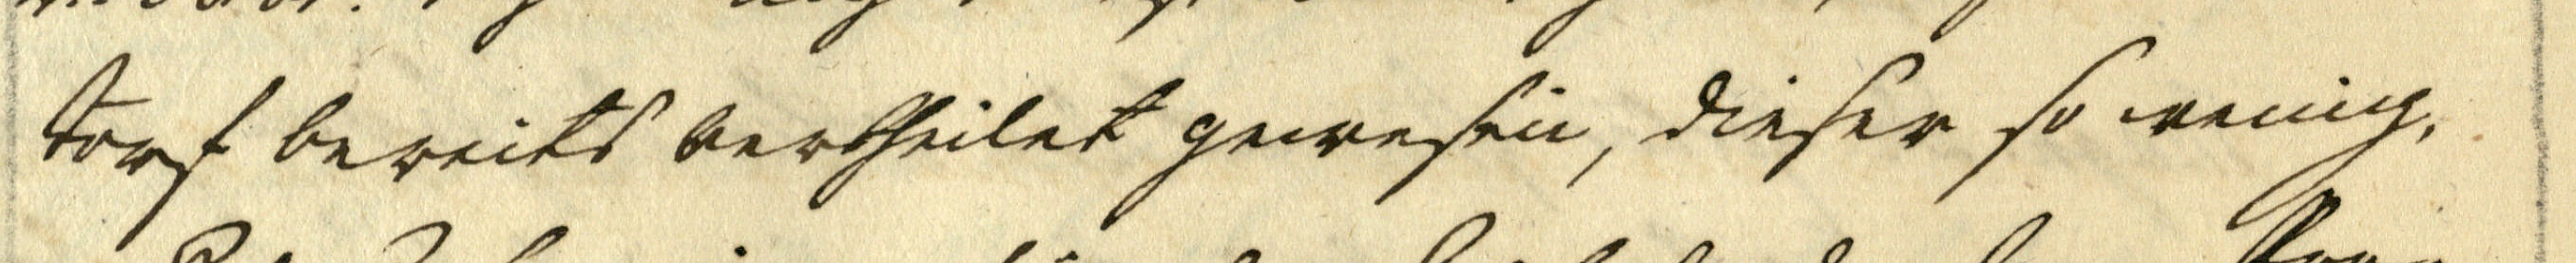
Torf bereits vertheilet gewesen, dieser so wenig,
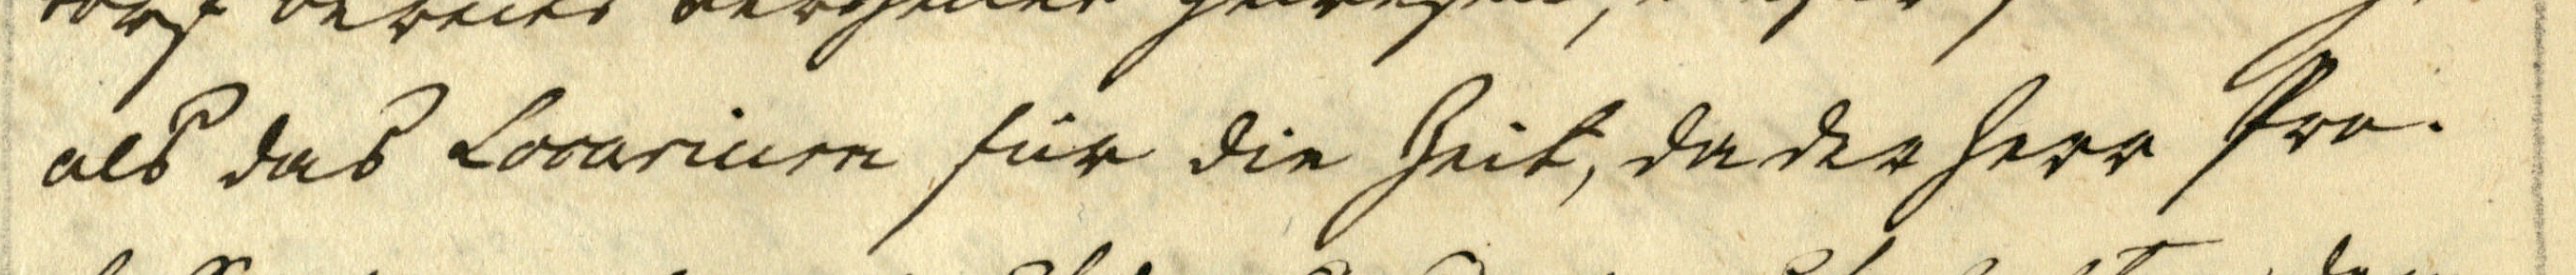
als das Locarium für die Zeit, da der Herr Pro¬
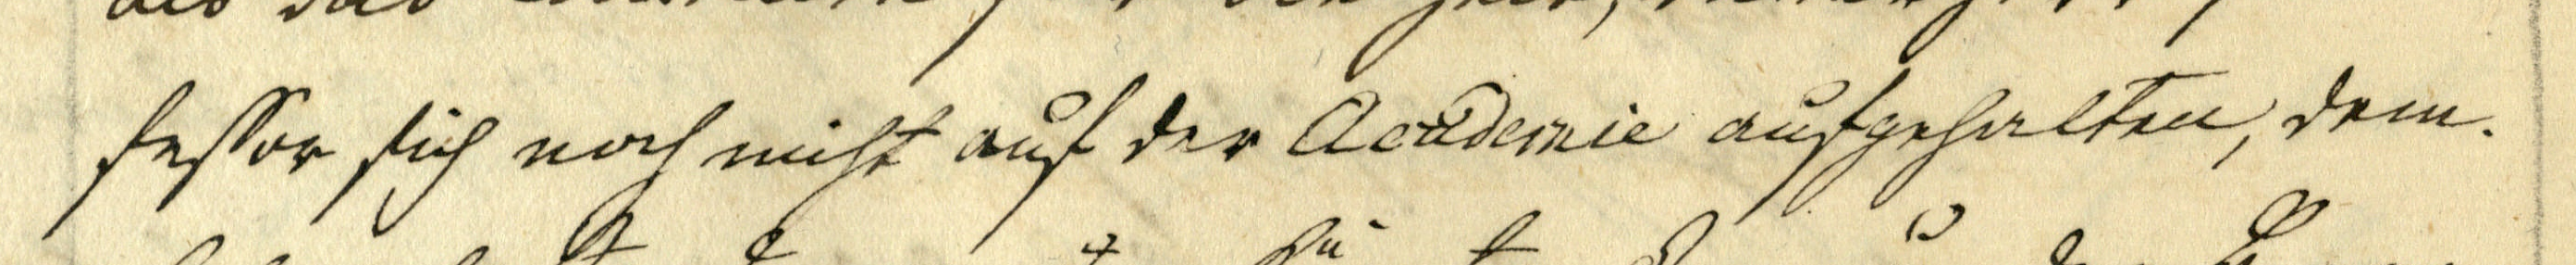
fessor sich noch nicht auf der Academie aufgehalten, dem¬
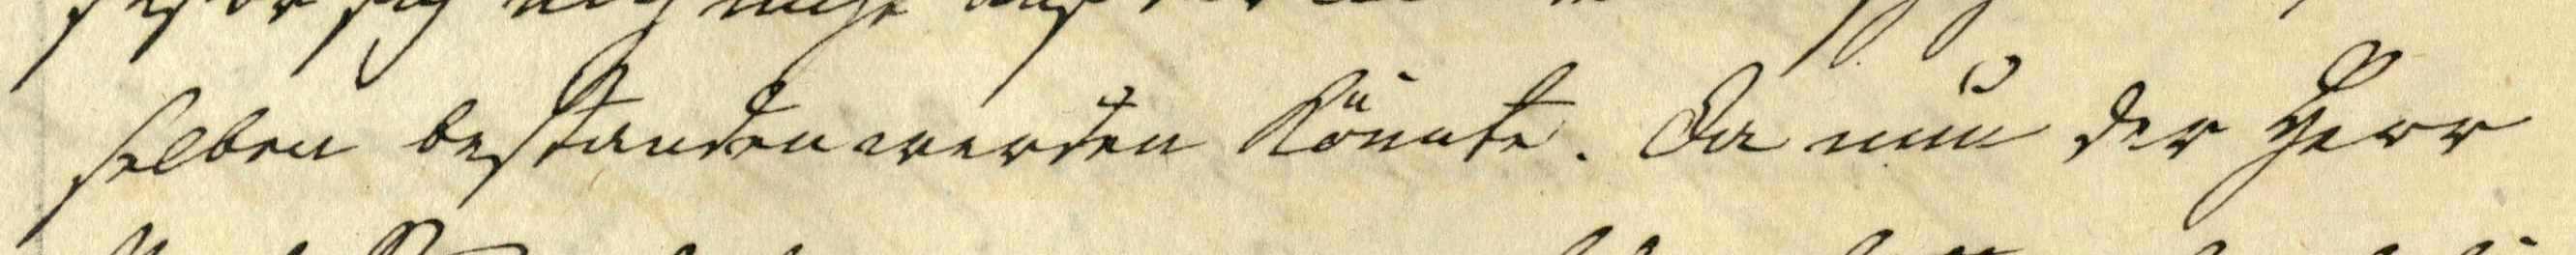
selben bestanden werden könnte. Da nun der Herr
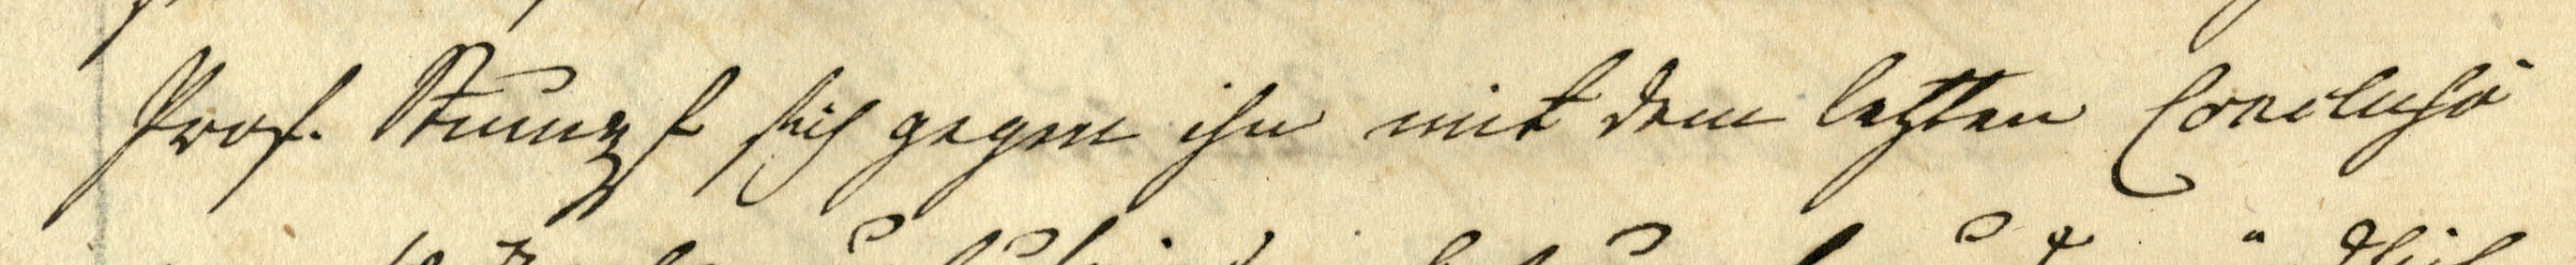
Prof. Stumpf sich gegen ihn mit dem letzten Concluso
